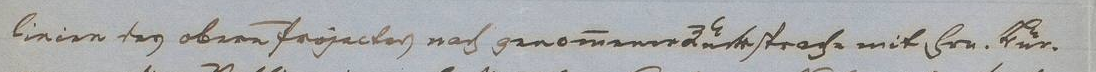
linien des oberen Projectes nach genommener Rücksprache mit Hrn. Bür-
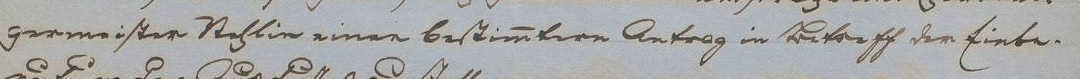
germeister Stehlin einen bestimmten Antrag in Betreff der Einbe-
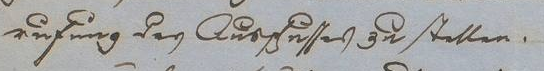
rufung des Ausschusses zu stellen.
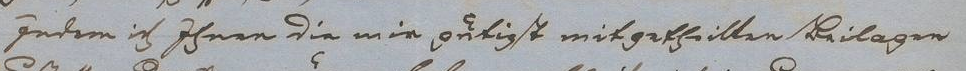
Indem ich Ihnen die mir gütigst mitgetheilten Beilagen
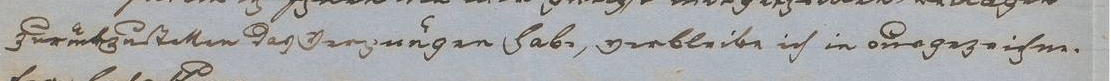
zurückzustellen das Vergnügen habe, verbleibe ich in ausgezeichne-
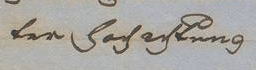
ter Hochachtung
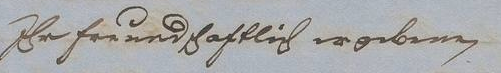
Ihr freundschaftlich ergebene
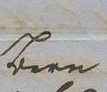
Bern
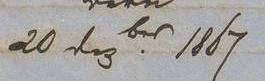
20 Dezber 1867
